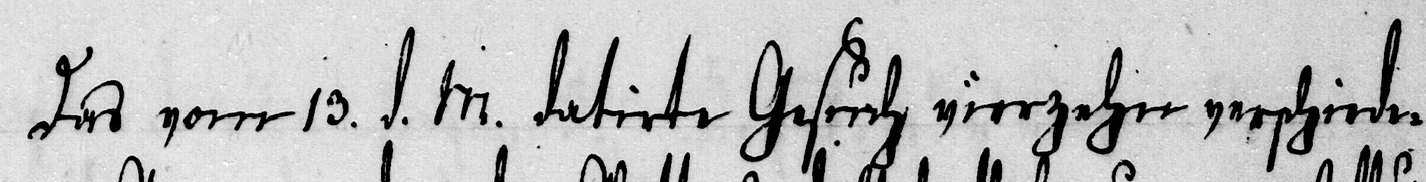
Das vom 13. d. M. datirte Gesuch vierzehn verschiede¬
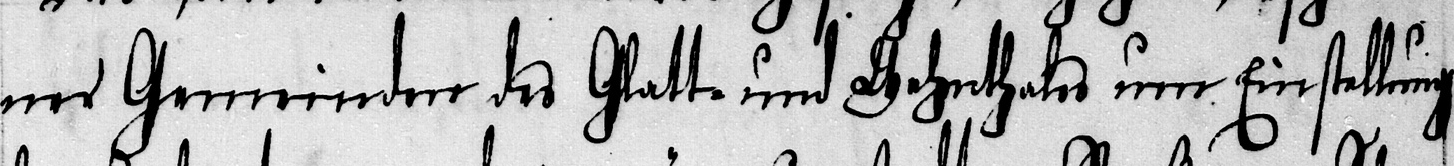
ner Gemeinden des Glatt- und Wehnthales um Einstellung
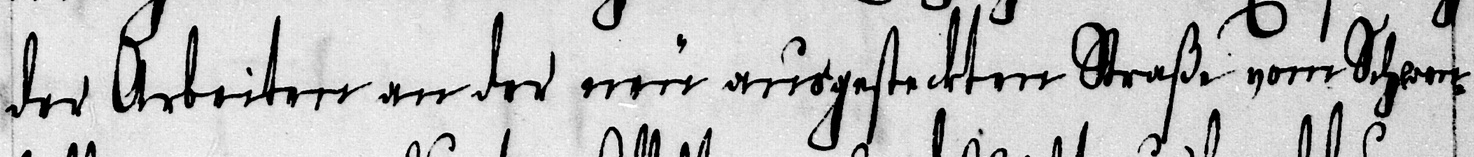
der Arbeiten an der neu ausgesteckten Straße vom Schwen¬
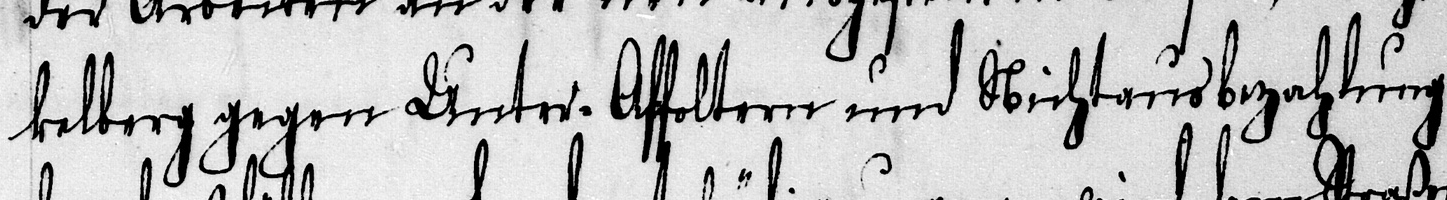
kelberg gegen Unter-Affoltern und Nichtausbezahlung
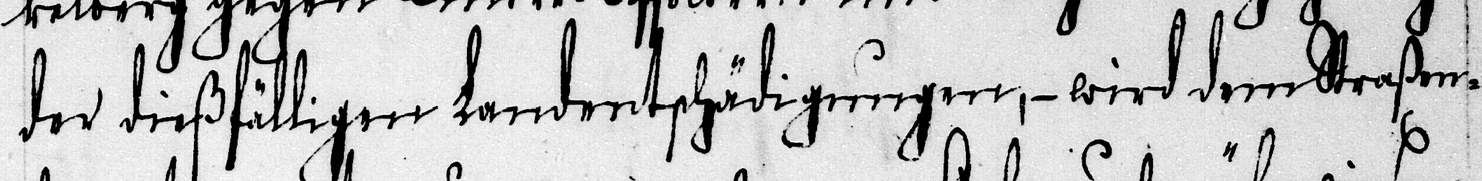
der dießfälligen Landentschädigungen, – wird dem Straßen¬
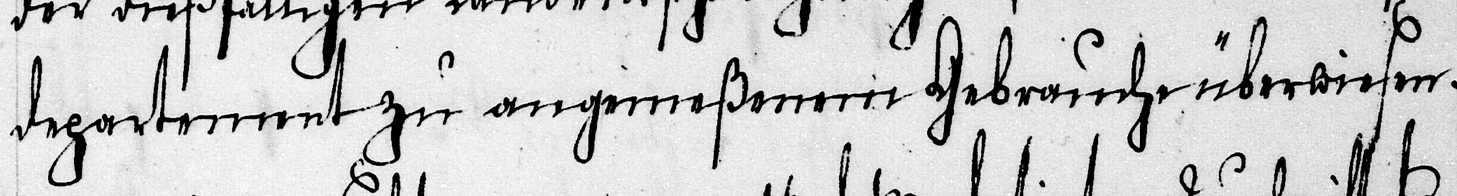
departement zu angemeßenem Gebrauche überwiesen.
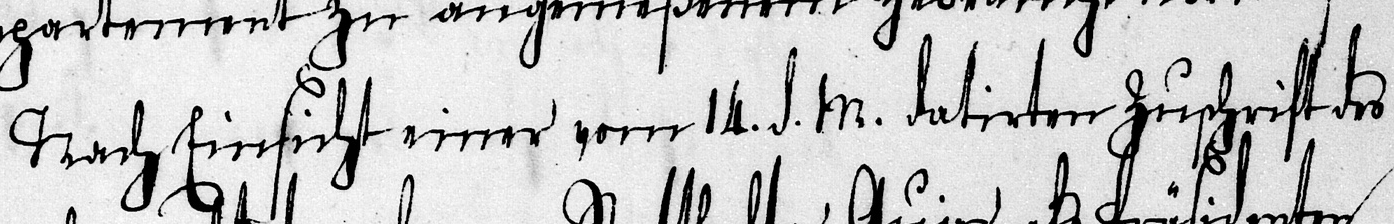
Nach Einsicht einer vom 14. d. M. datirten Zuschrift des
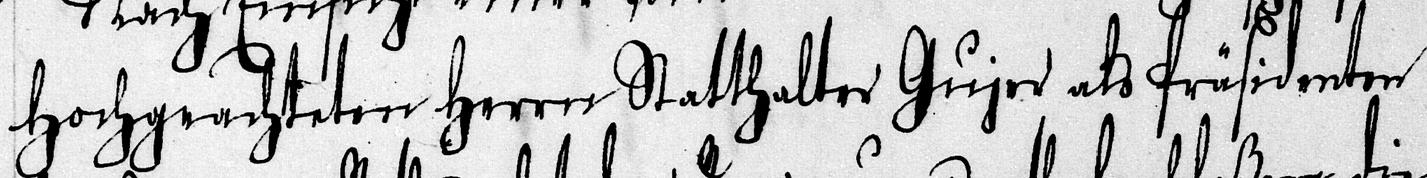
Hochgeachteten Herrn Statthalter Gujer als Präsidenten
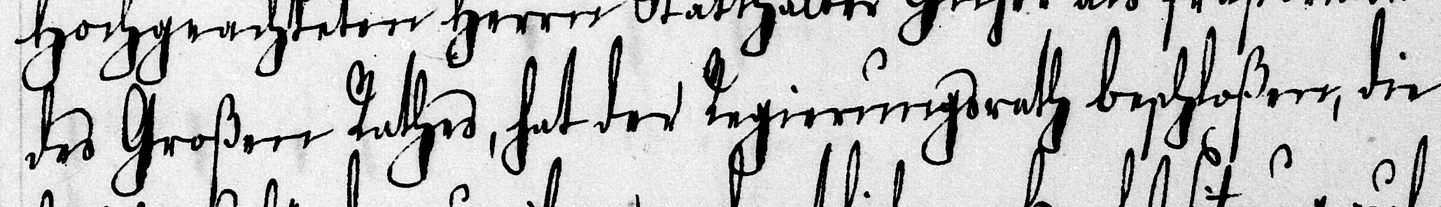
des Großen Rathes, hat der Regierungsrath beschloßen, die
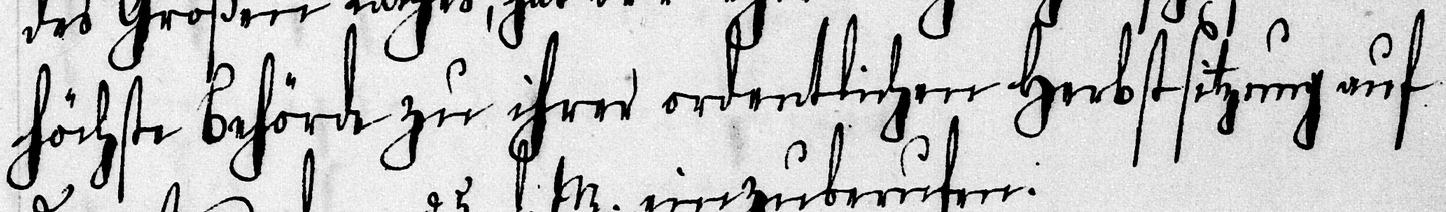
höchste Behörde zu ihrer ordentlichen Herbstsitzung auf
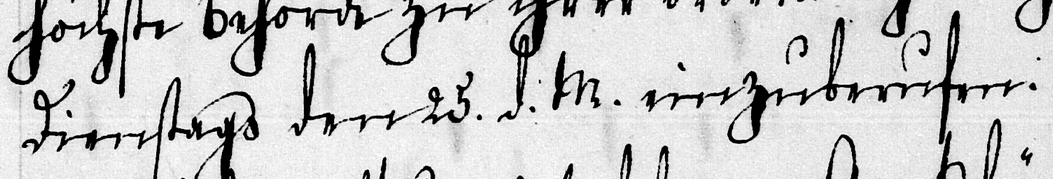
Dienstags den 25. d. M. einzuberufen.
